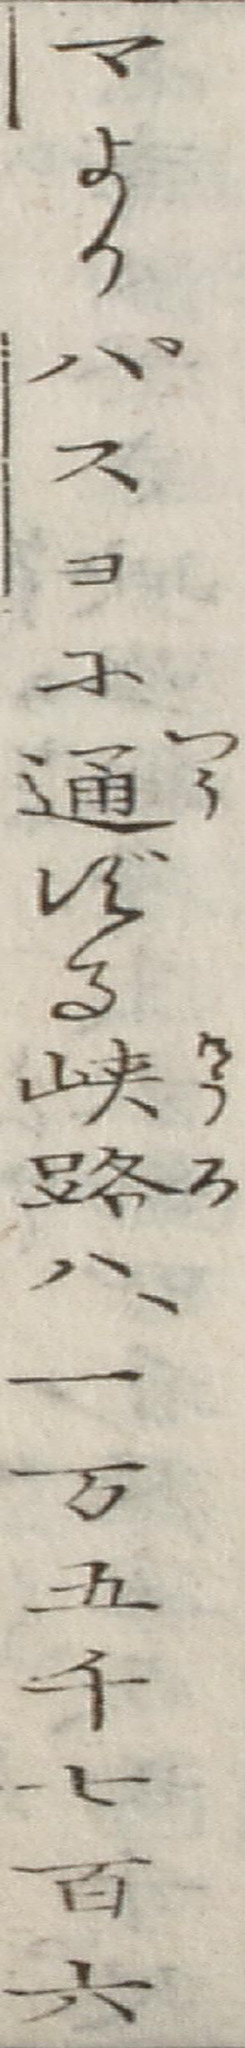マよりパスヨに通ずる峡路は、一万五千七百六
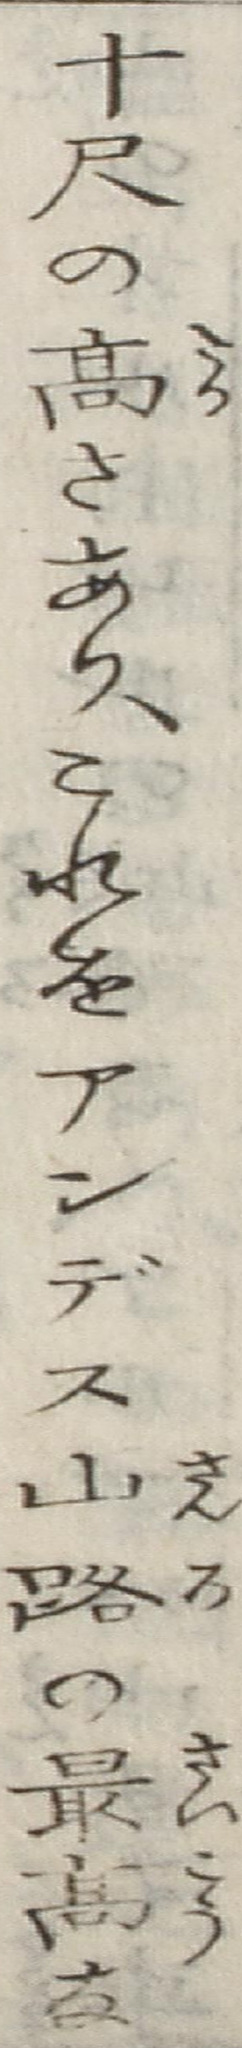十尺の高さあり、これをアンデス山路の最高な
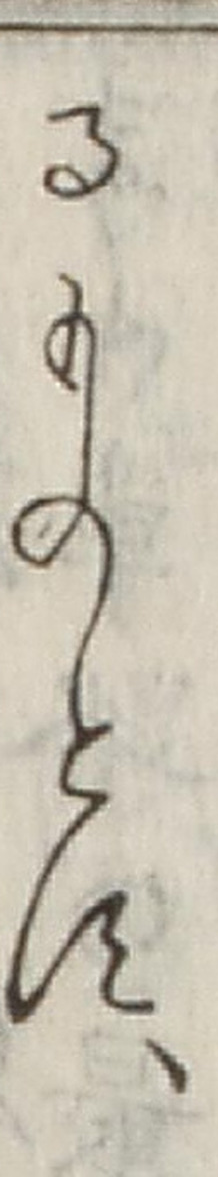るものとす、
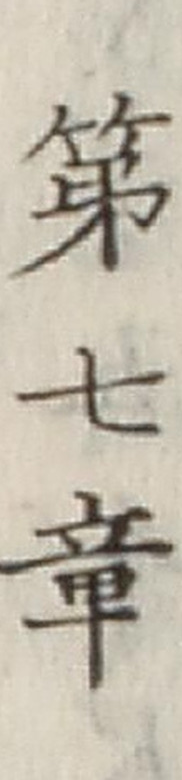第七章
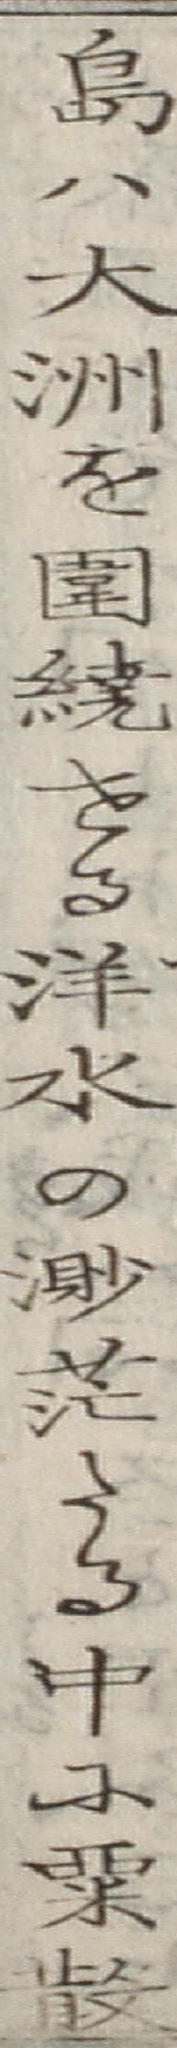島は大洲を囲繞せる洋水の渺茫たる中に粟散
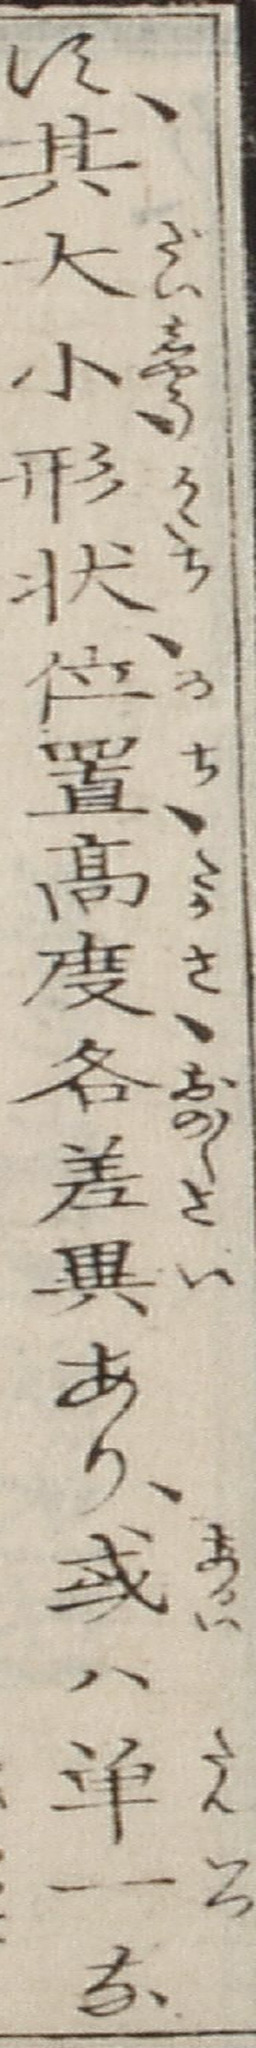す、其大小、形状、位置、高度、各差異あり、或は単一な
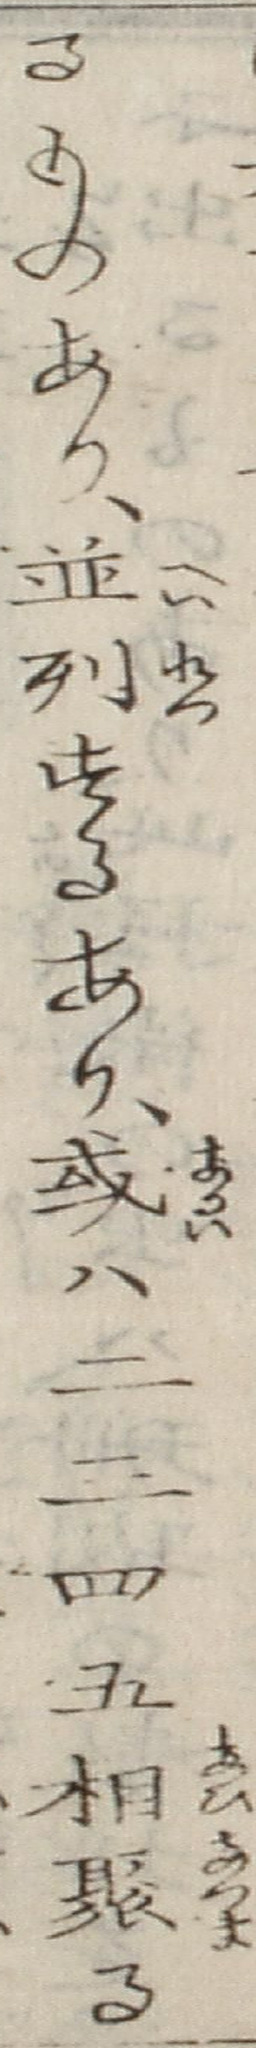るものあり、並列するあり、或は二三四五相聚る
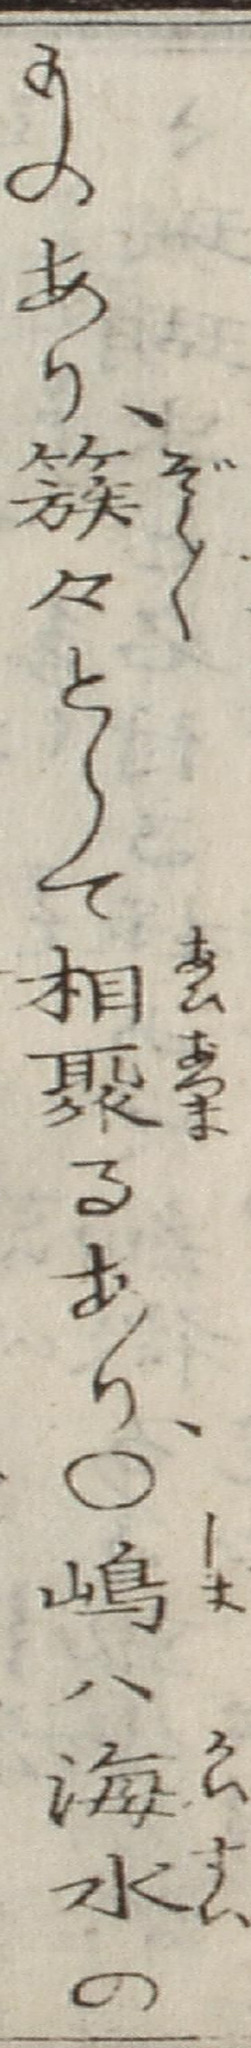ものあり、簇々として相聚るあり、○嶋は海水の
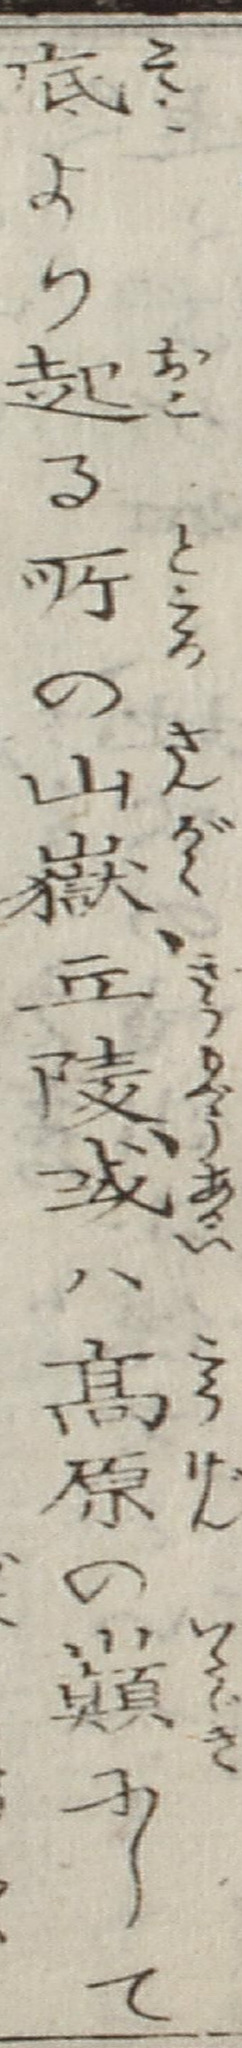底より起る所の山嶽、丘陵、或は高原の頂にして
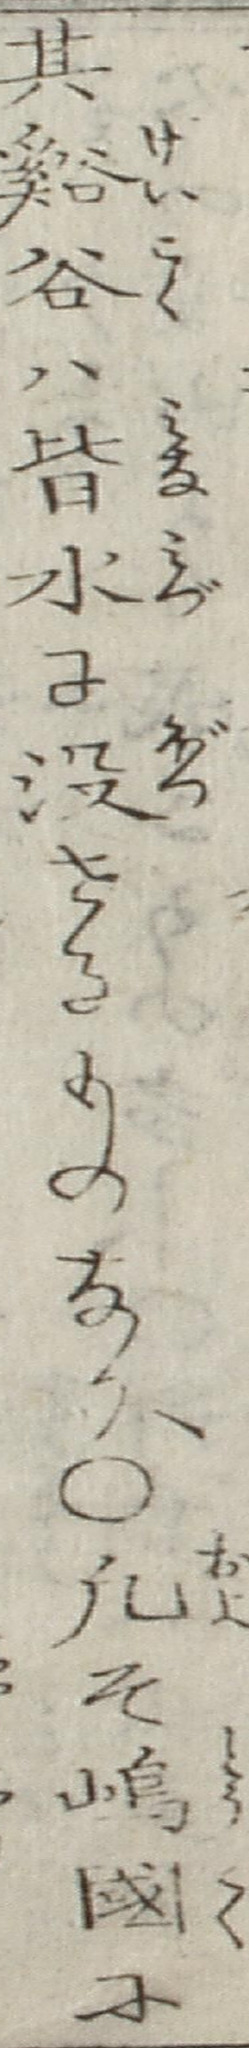其溪谷は皆水に没せるものなり、○凡そ嶋国に
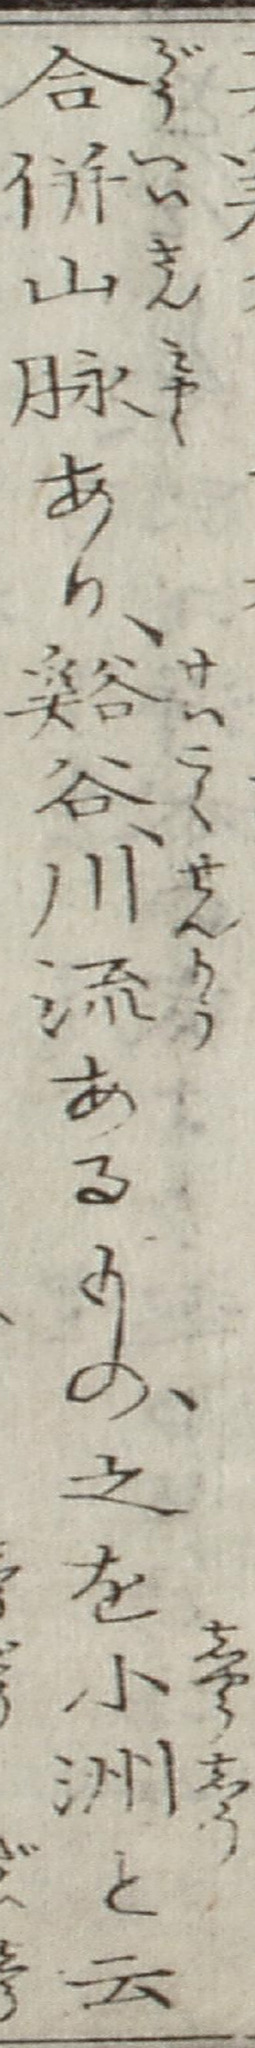合併山脈あり、溪谷、川流あるもの、之を小洲と云
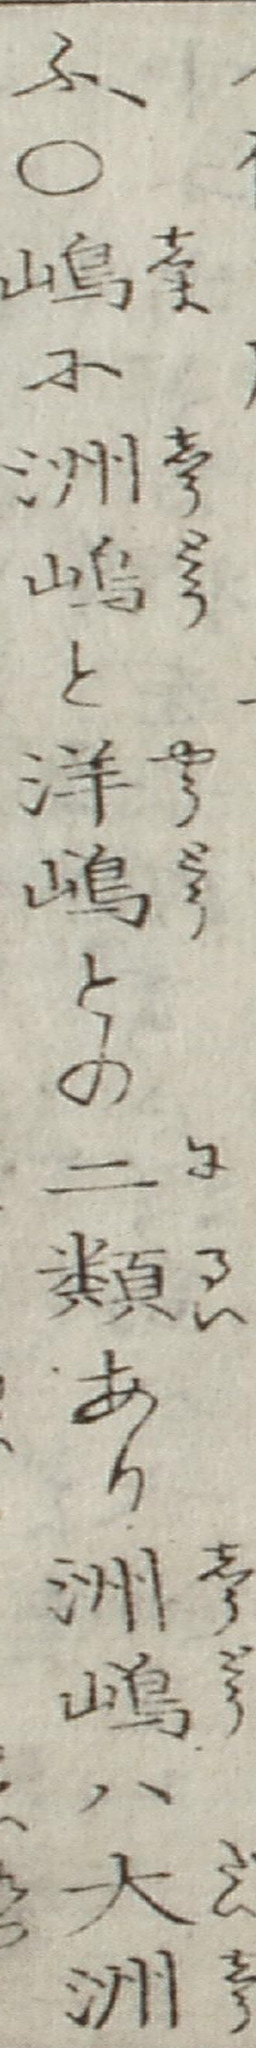ふ、○嶋は洲嶋と洋嶋との二類あり洲嶋は大洲
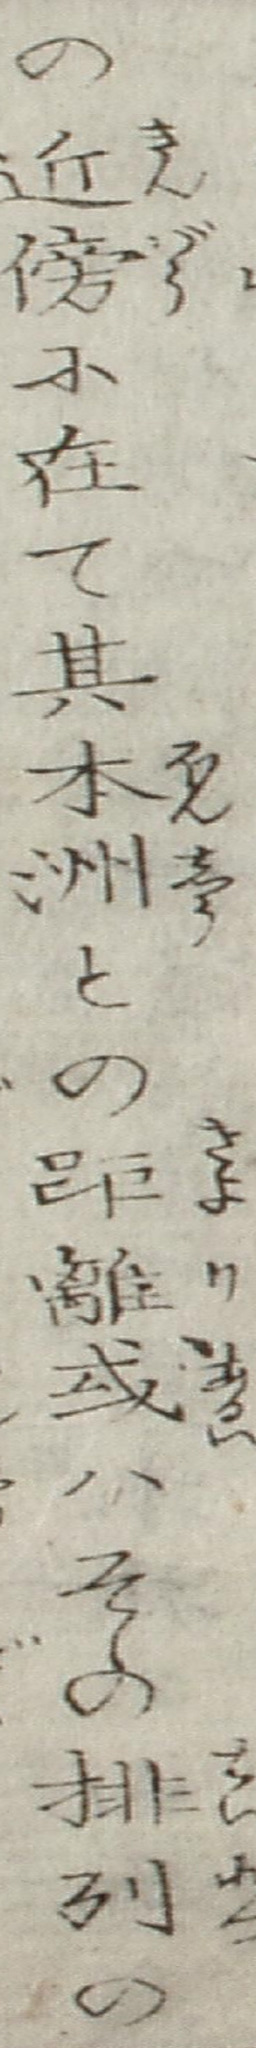の近傍に在て其本洲との距離、或はその排列の
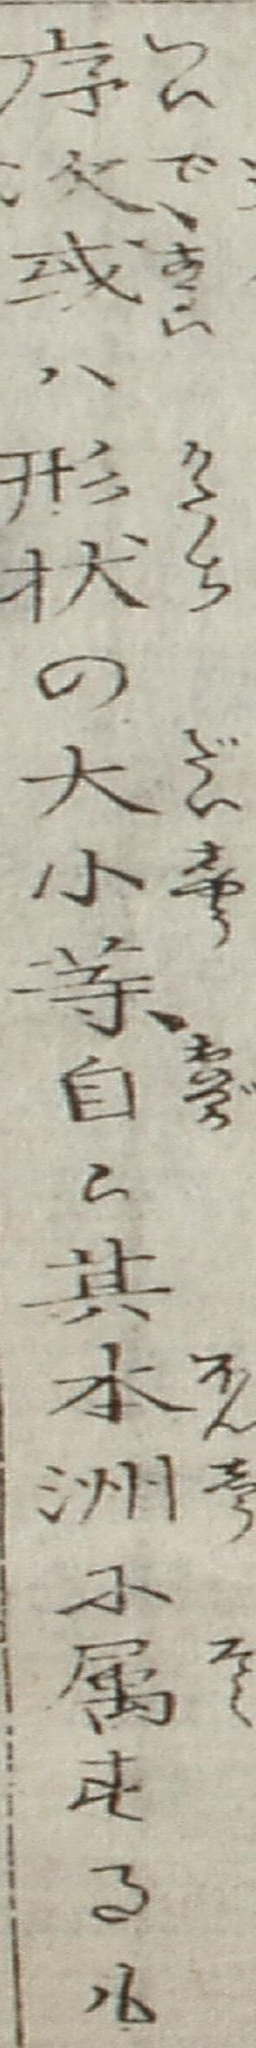序次、或は形状の大小等、自ら其本洲に属するも

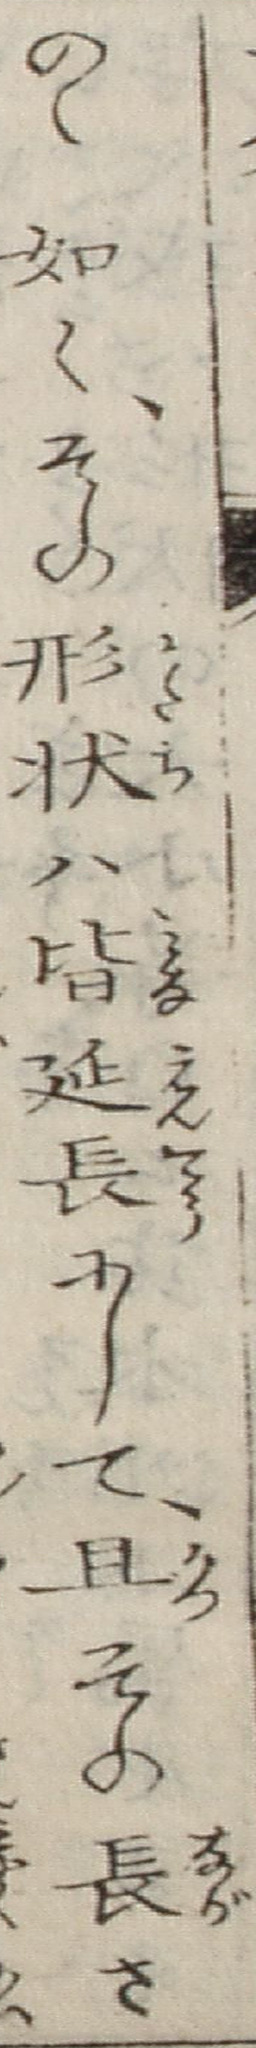のゝ如く、その形状は皆延長にして、且その長さ
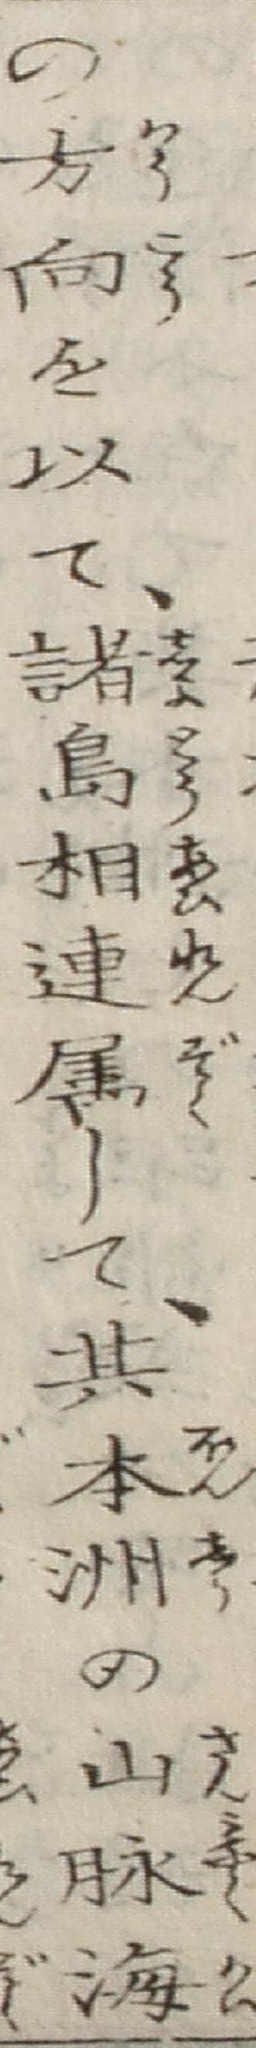の方向を以て、諸島相連属して、其本洲の山脈海
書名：訓蒙　天然地理學　上
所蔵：東京大学地震研究所図書室 Earthquake Research Institute Library, The University of Tokyo, JAPAN
